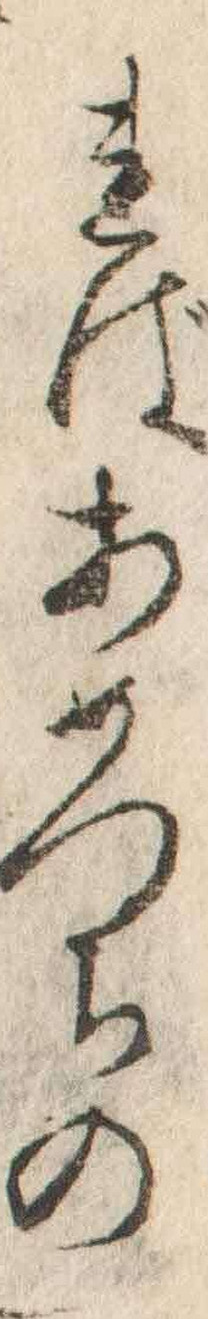ればあめつちの
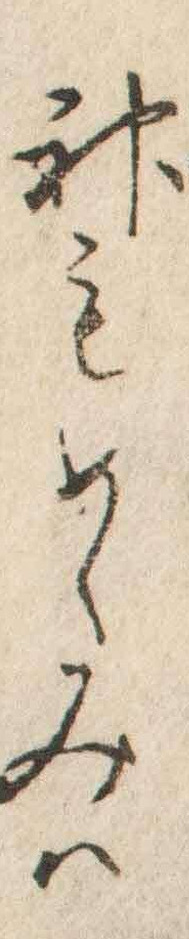神もめくみは
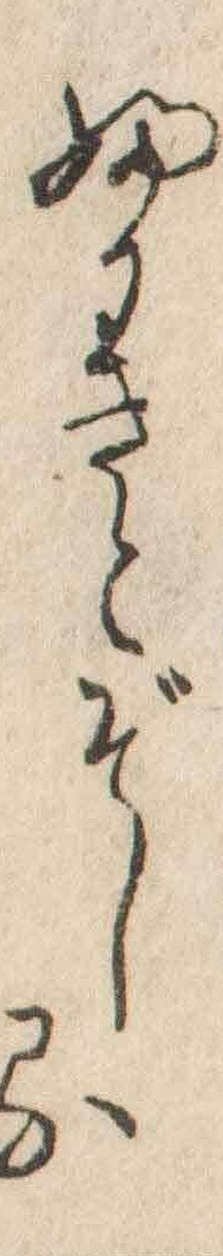ふかきとぞし
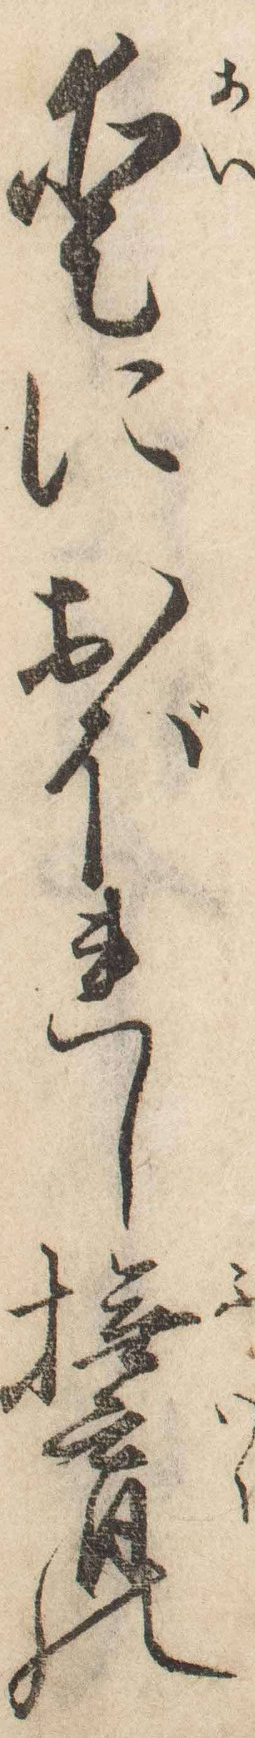愛におぼれし撫育の

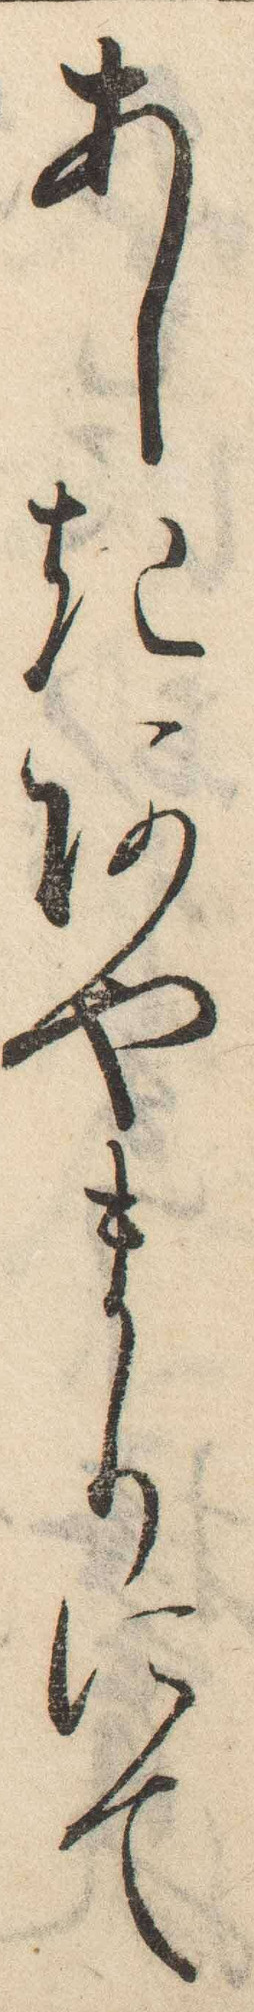あしきあやまりにて
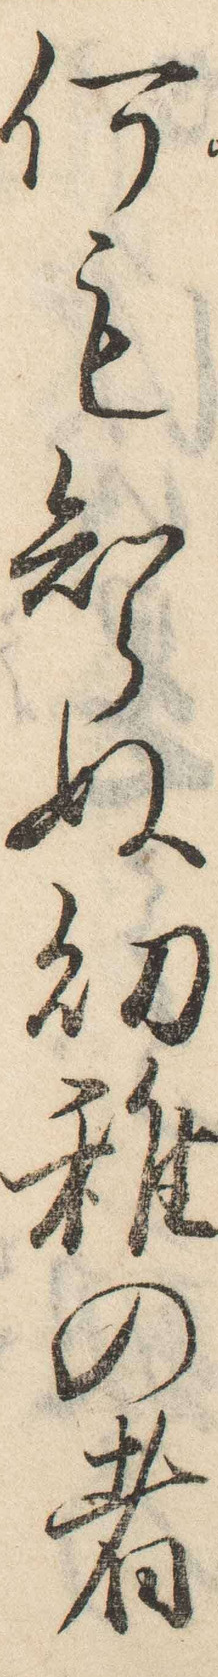何も知らぬ幼稚の者
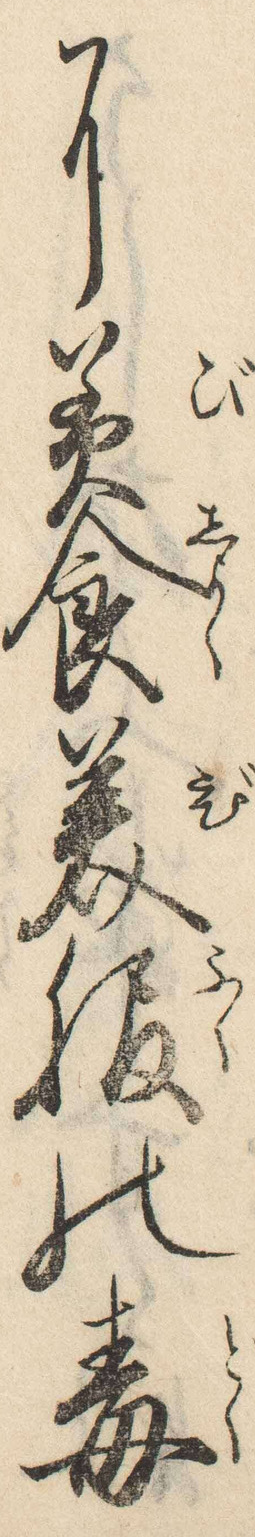に美食美服の毒
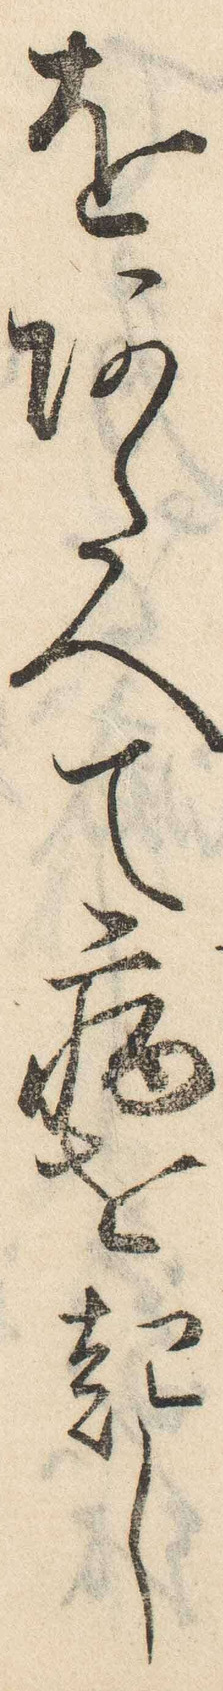をあたへて病を起し
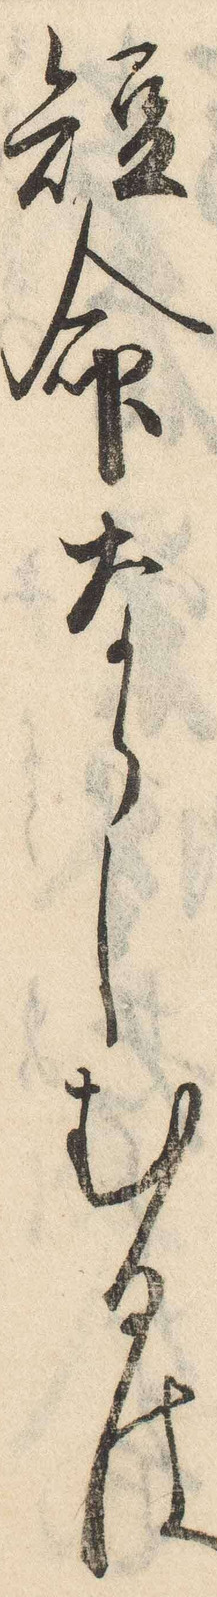短命ならしむるは
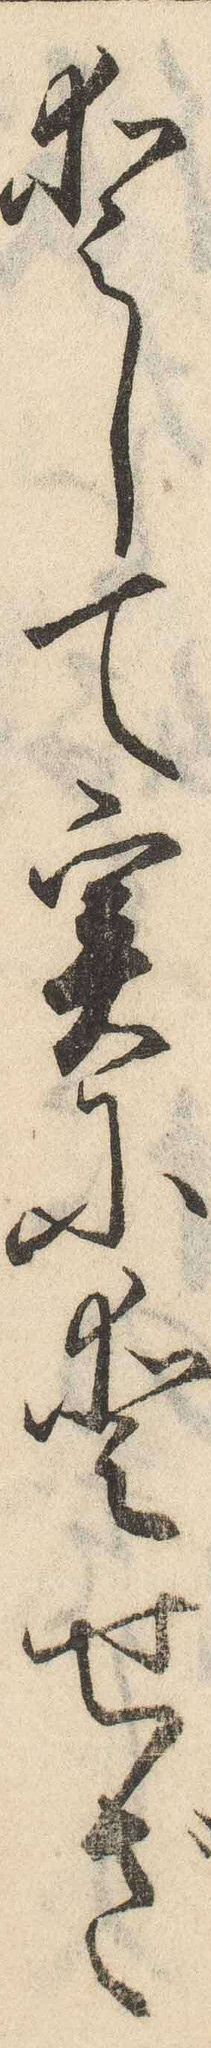愛して実に愛せざ
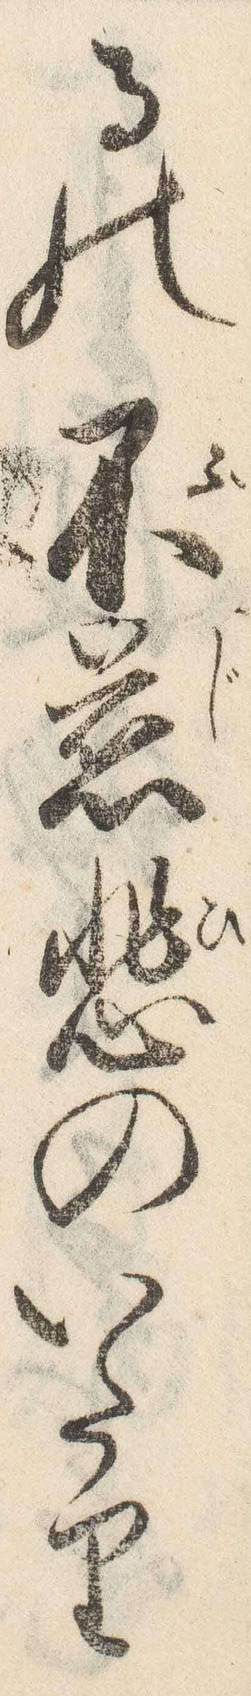るの不慈悲のいたり
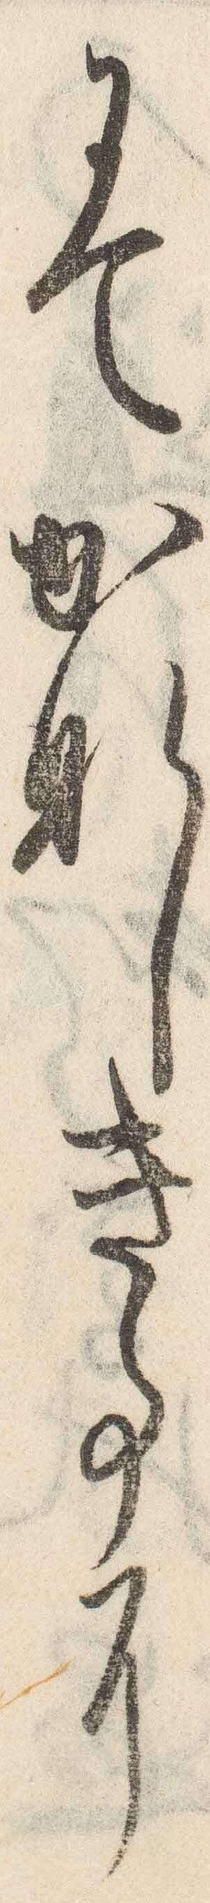にてかなしき事に
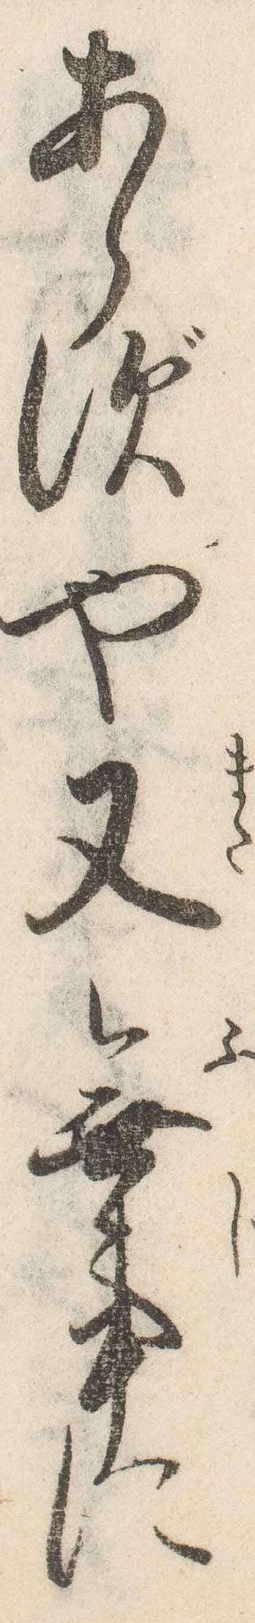あらずや又無事に
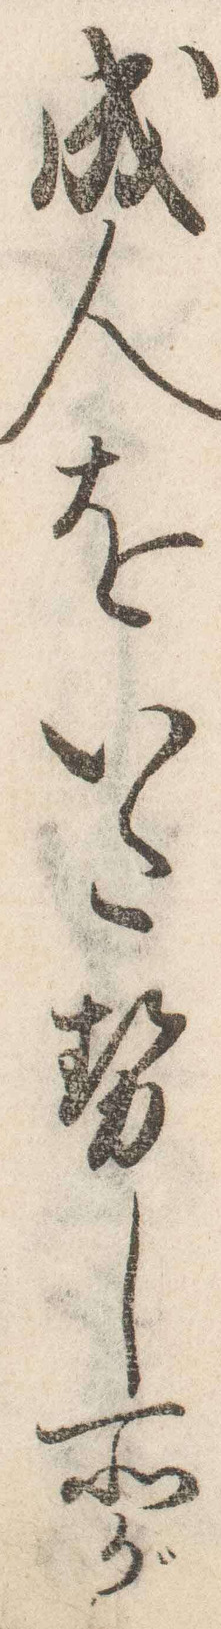成人をいたせし所が
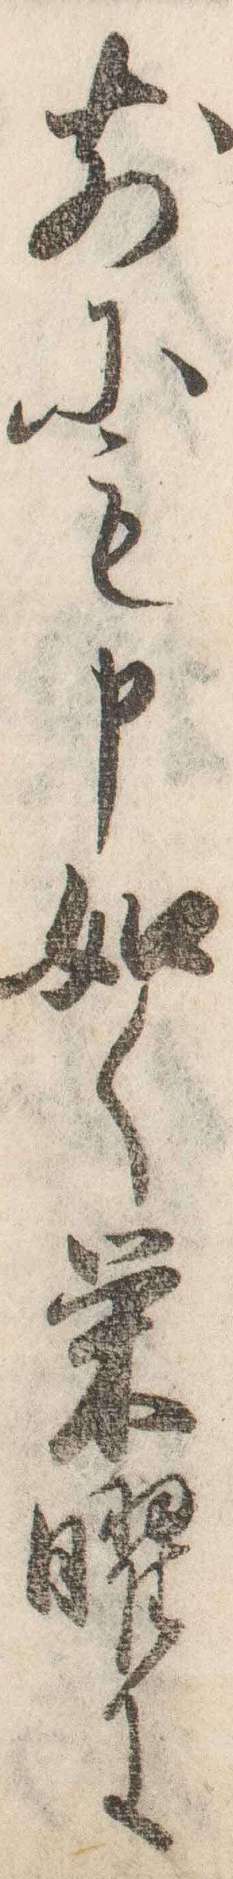前にも申如く栄耀に
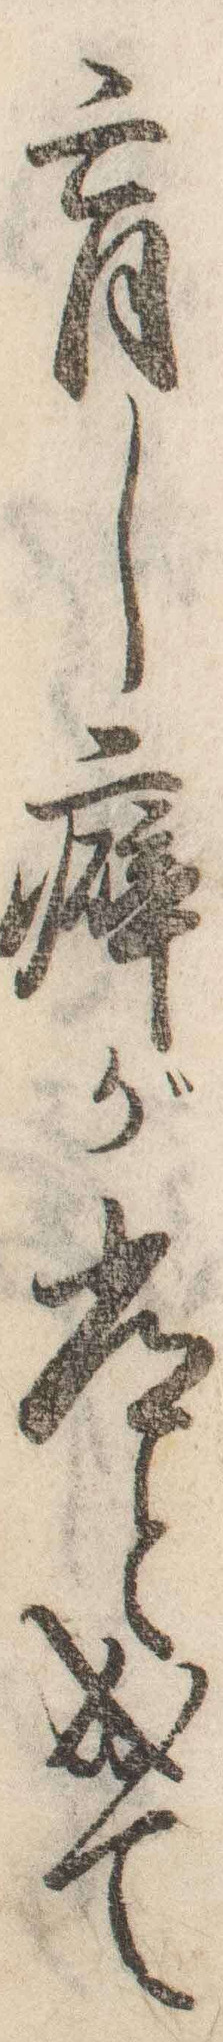育し癖が常と成て
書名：撫育草
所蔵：東京学芸大学附属図書館 国文学研究資料館
